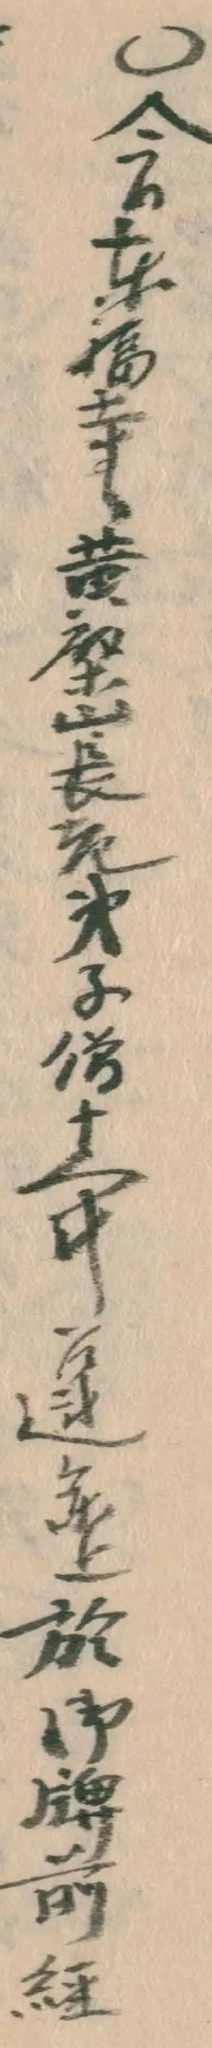○今日東福寺へ黄檗山長老弟子僧十人中召連参上於御牌前経
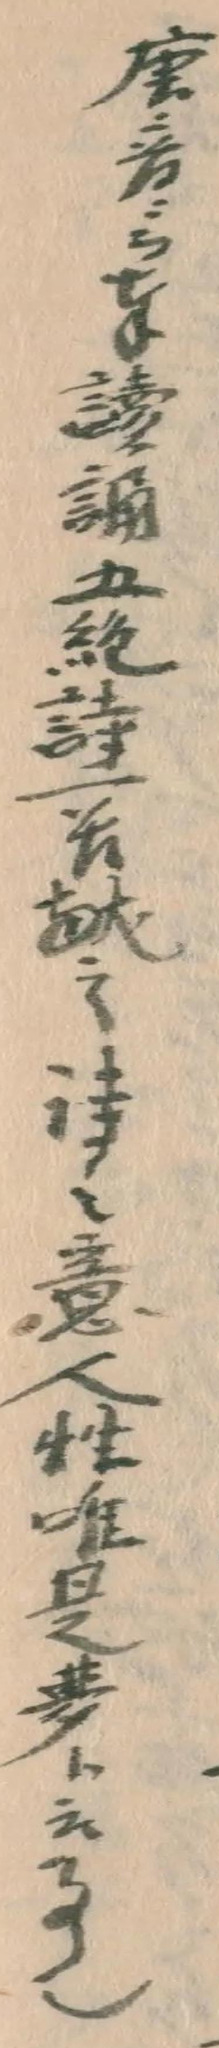唐音ニ而奉讀誦五絶詩一節献之詩之意人性唯是夢ト云事也
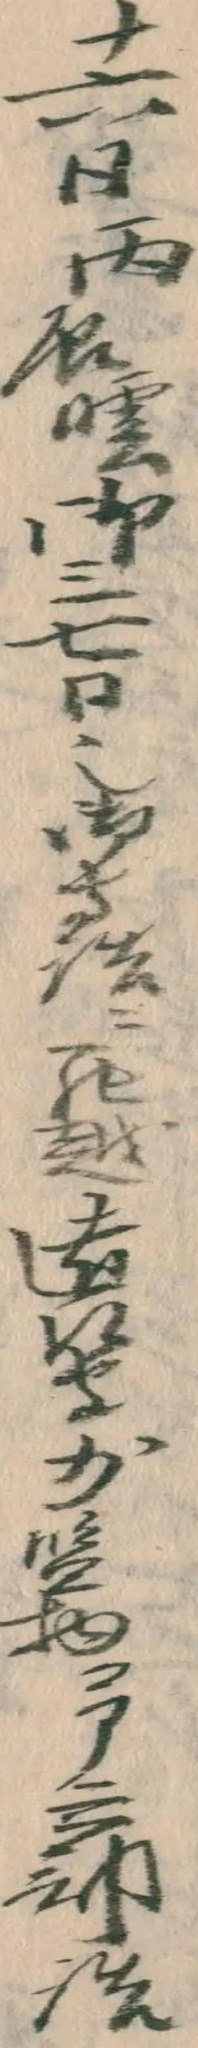十六日丙辰晴御三七日之御寺詰ニ罷越遠江守少堅物予三郎詰
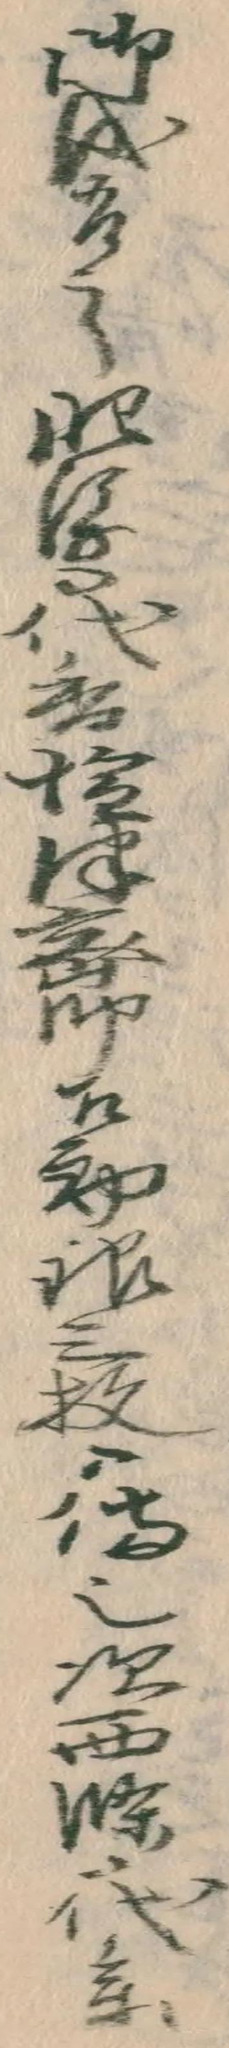御成有之肥後御代香塩津密助召勤銀三枚は御備也次西條御代参
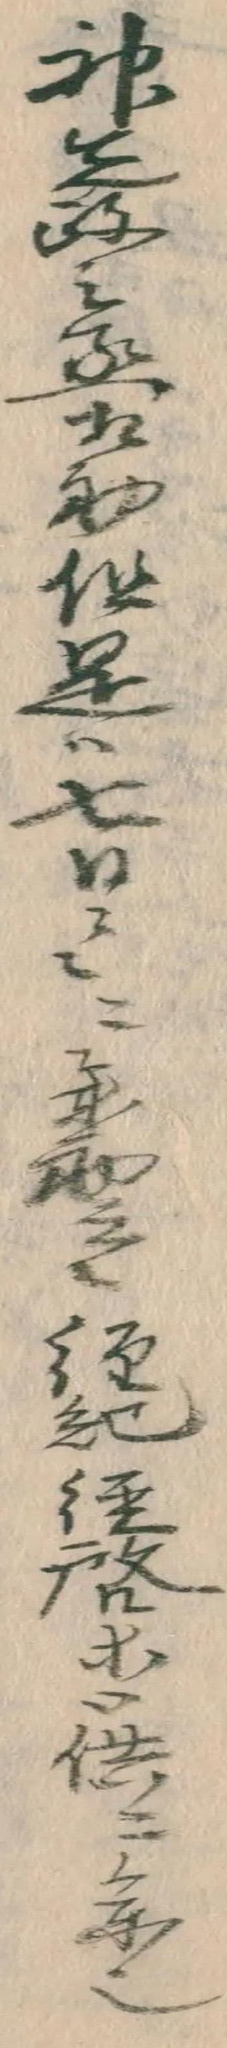神先政之丞相勤但是御七日々々ニ参初云々経紀経啓等御供ニ参也
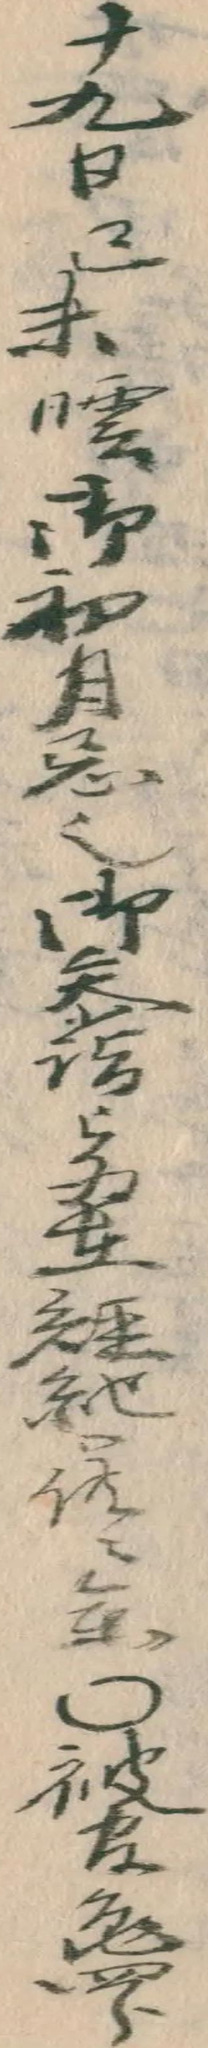十九日己未晴御初月忌也御参詣被為在短紀御供ニ参〇被官兎四郎
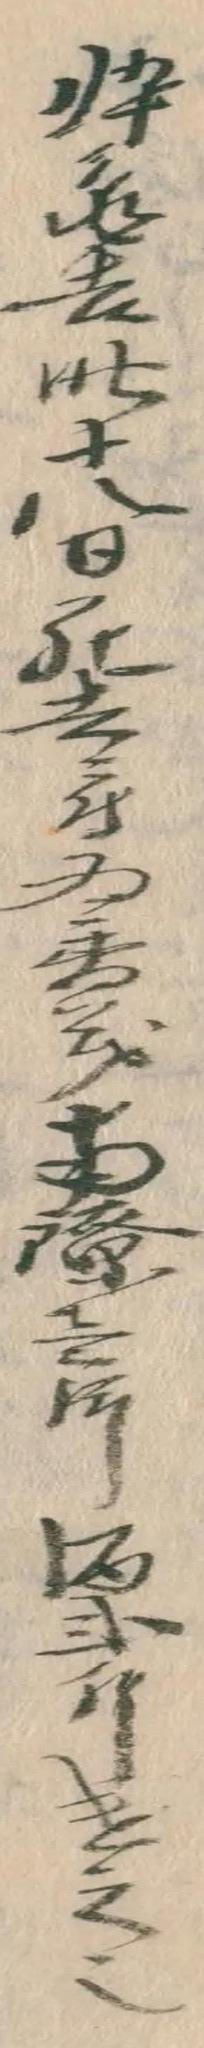忰亀吉昨十八日死去に付為香義南鐐壱片酒弐升遣之也
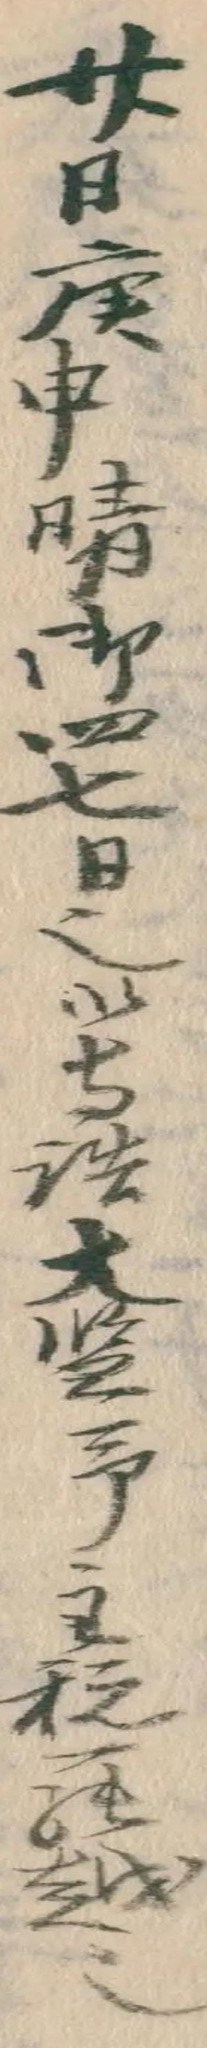廿日庚申晴御四七日也御寺詰大監予主税罷越也
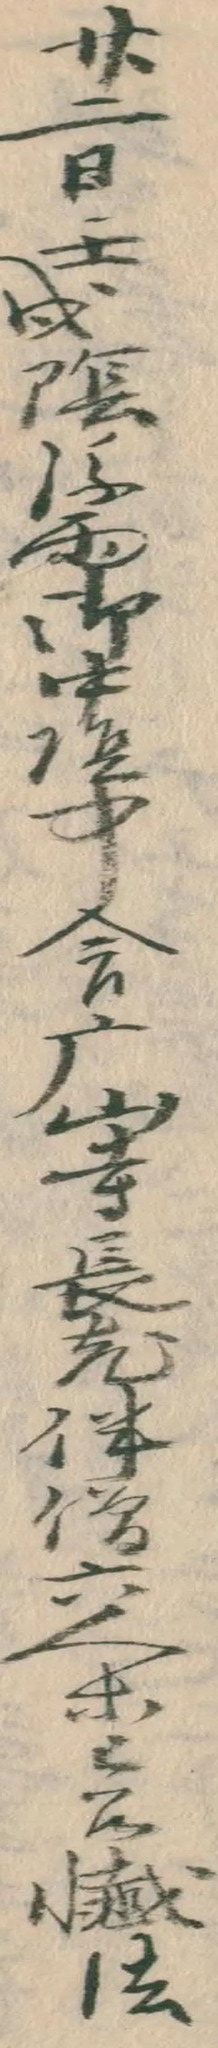廿二日壬戌陰後雨御中陰中今日摩山寺長老伴僧六人等被召懺法
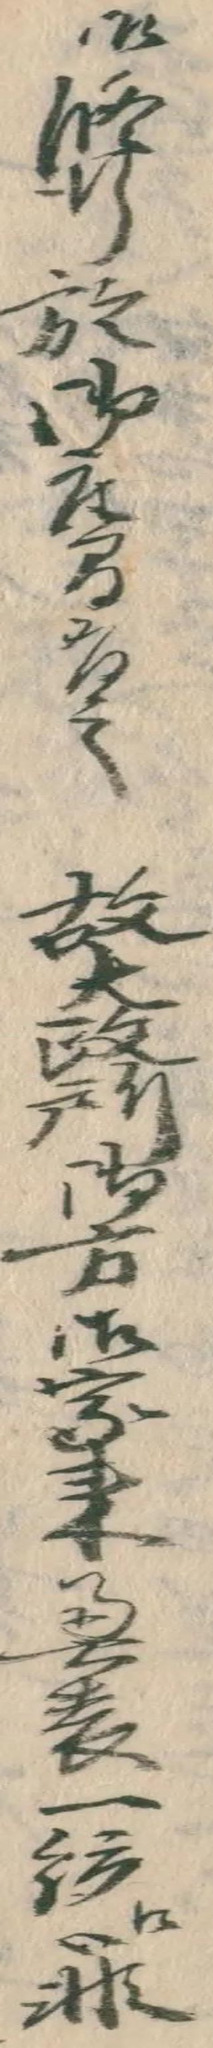御修行於御座間有之故大政所御方御家来奥表一統え御非
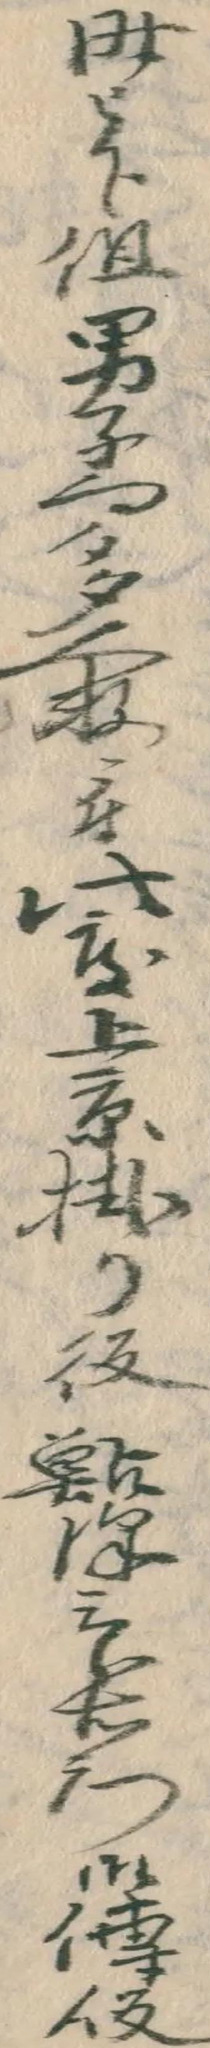時被下但男子向多人数ニ付此度上京掛り役鮎澤三郎右衛門御傳役
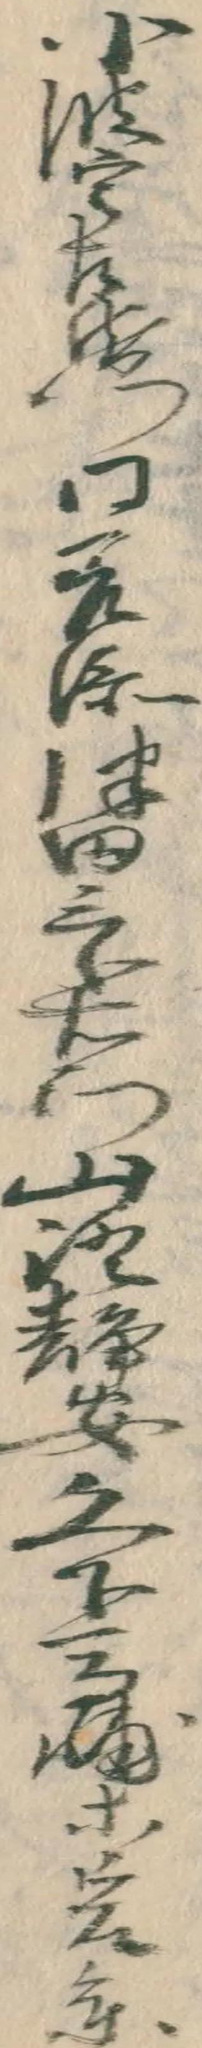小波宇左衛門同差添津田三郎右衛門山路静安久下馬輔等差参
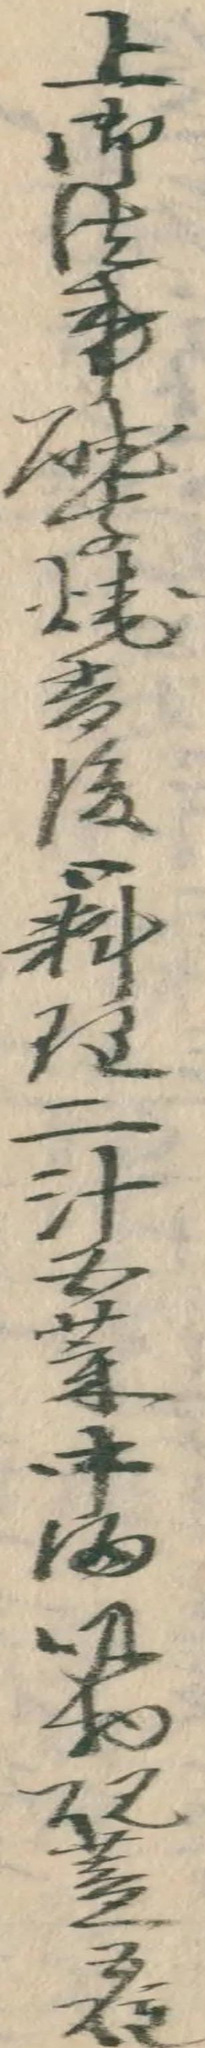上御法事焼香後御料理二汁五菜中酒吸物硯蓋五種
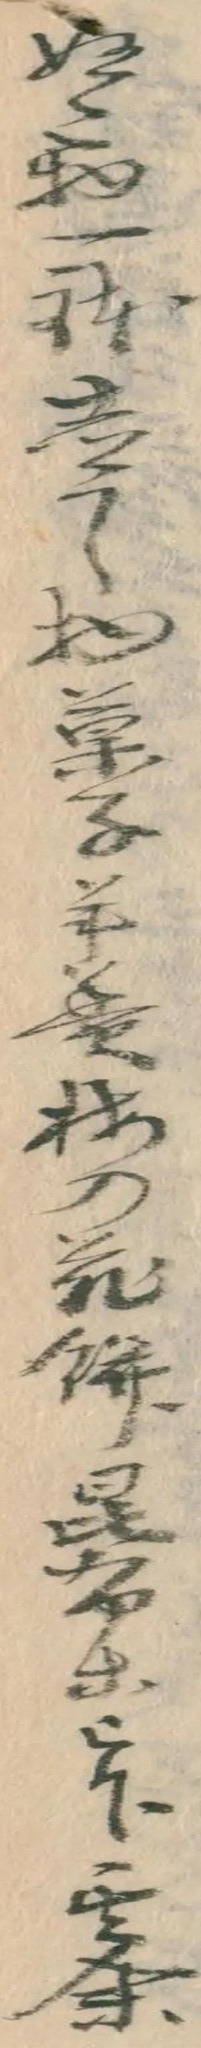ぬた物一鉢したし物菓子羊羹梅の花餅昆布等被下其余

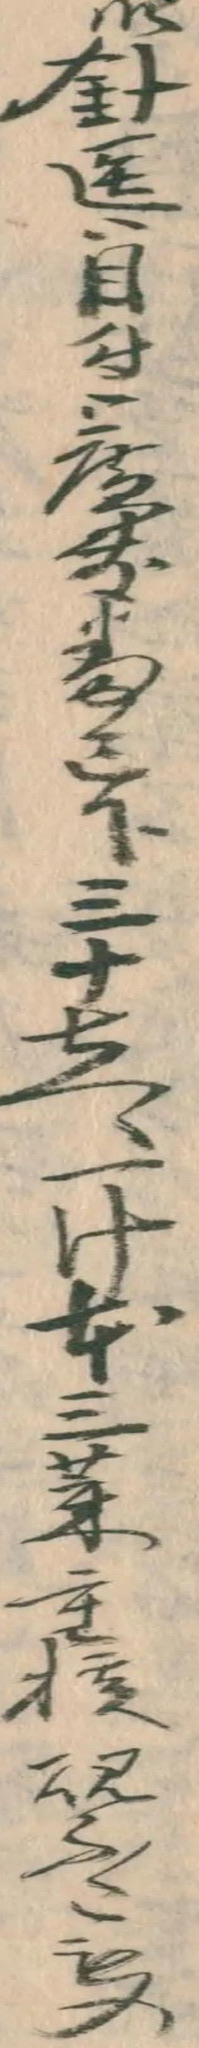御針医御目付御廣敷番已下三十七人へ一汁本三菜重核硯ふたもの
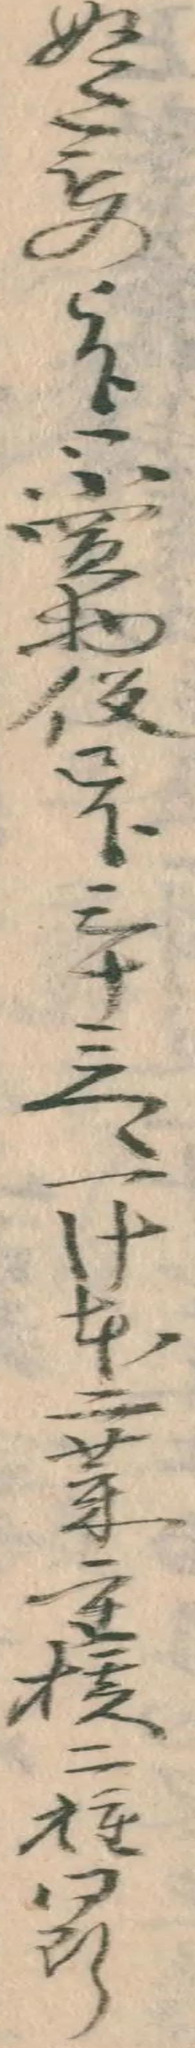ぬたもの已下御小買物役已下三十三人へ一汁本二菜重核二種同断
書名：賀茂社記録. 第69冊
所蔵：国立国会図書館 National Diet Library, JAPAN
